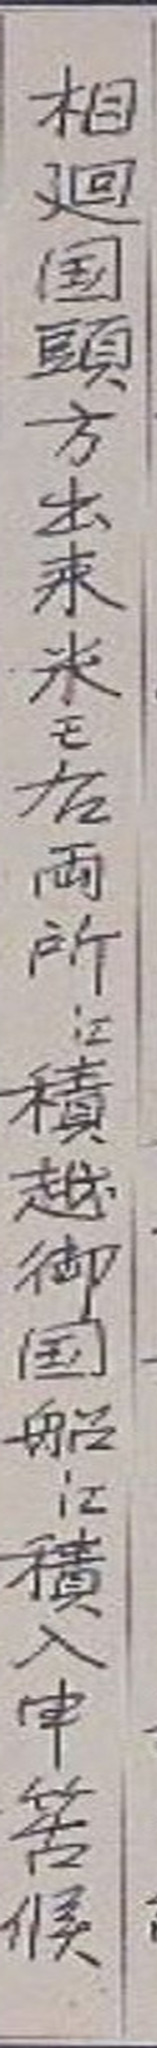相廻国頭方出来米も右両所え積越御国船え積入申筈候
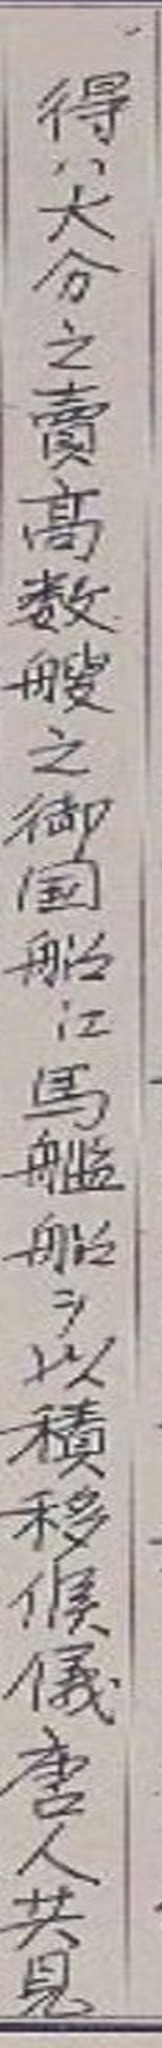得は大分之売高数艘之御国船え馬艦船を以積移候儀唐人共見
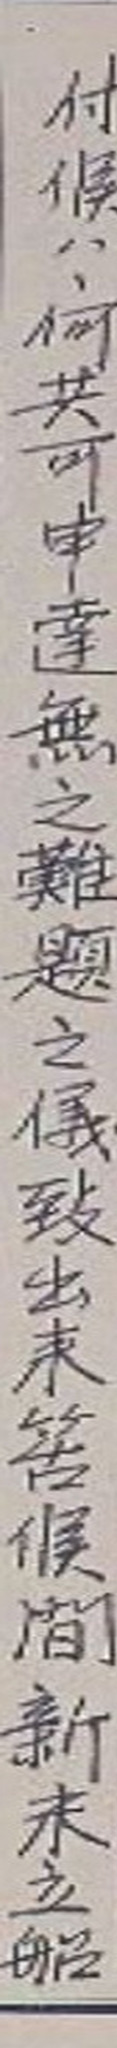付候はゝ何共可申達無之難題之儀致出来筈候間新米立船
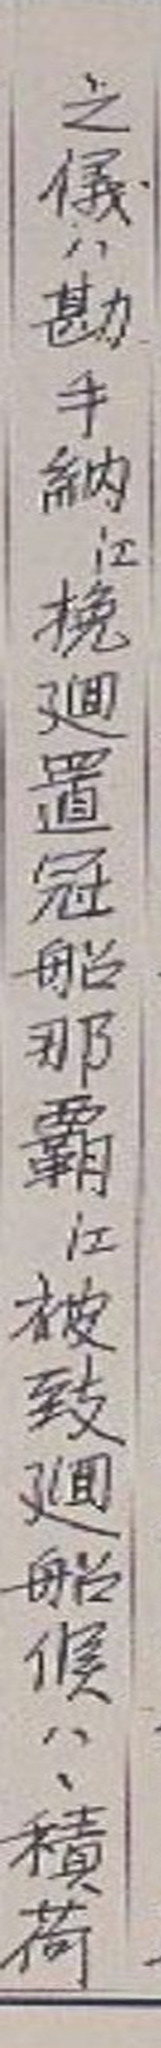之儀は勘手納え挽廻置冠船那覇え被致廻船候はゝ積荷
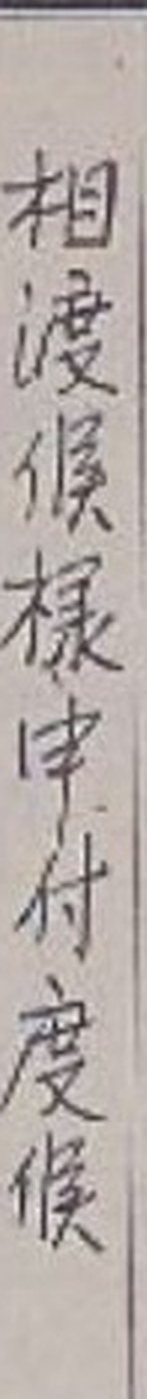相渡候様申付度候
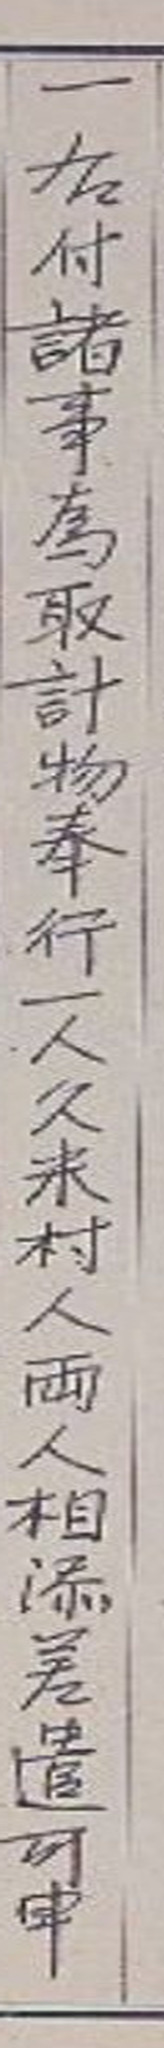一右付諸事為取計物奉行一人久米村人両人相添差遣可申
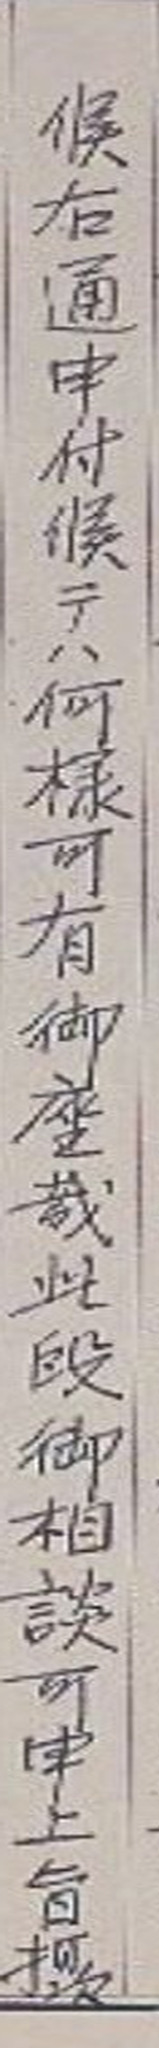候右通申付候ては何様可有御座哉此段御相談可申上旨摂
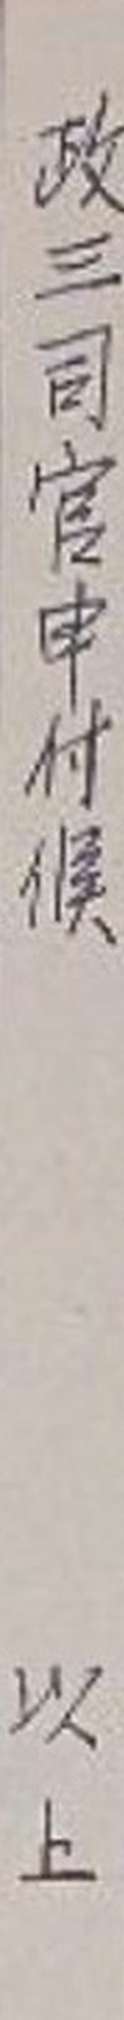政三司官申付候以上
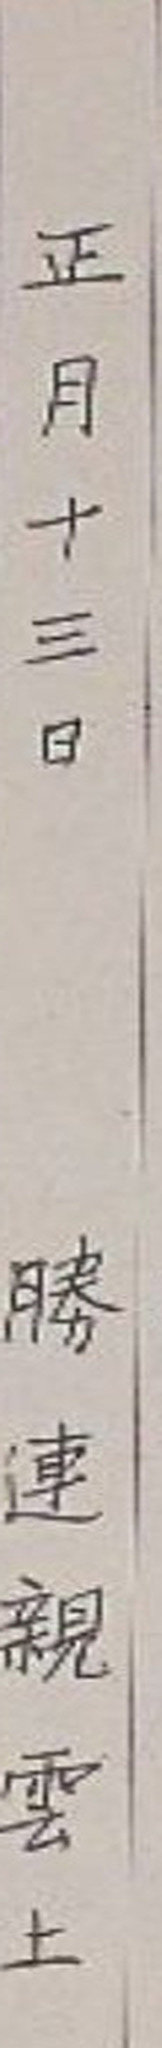正月十三日勝連親雲上
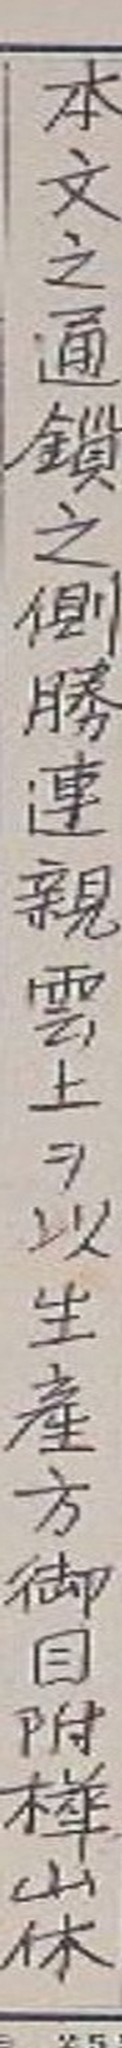本文之通鎖之側勝連親雲上を以生産方御目附樺山休
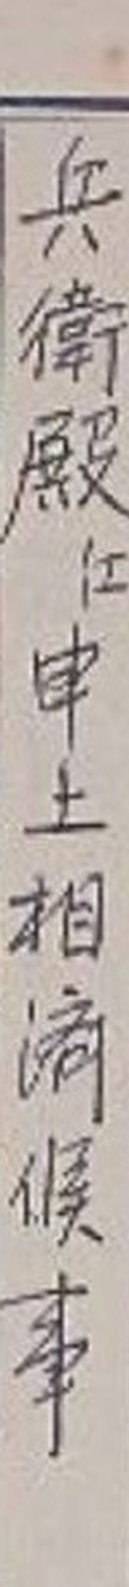兵衛殿え申上相済候事
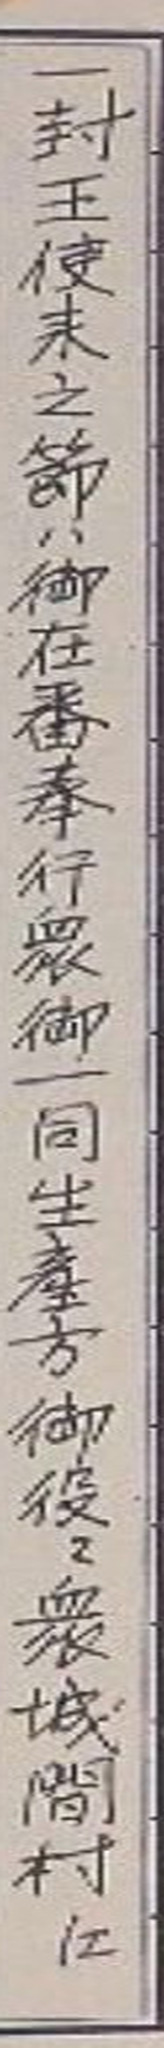一封王使来之節は御在番奉行衆御一同生産方御役々衆城間村え
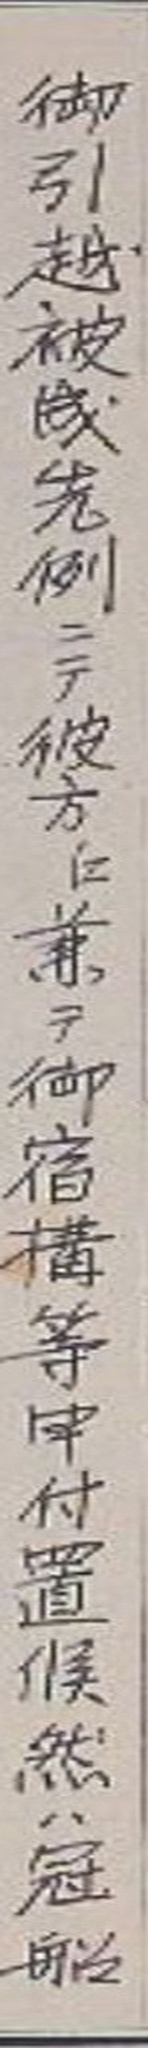御引越被成先例にて彼方え兼て御宿構等申付置候然は冠船
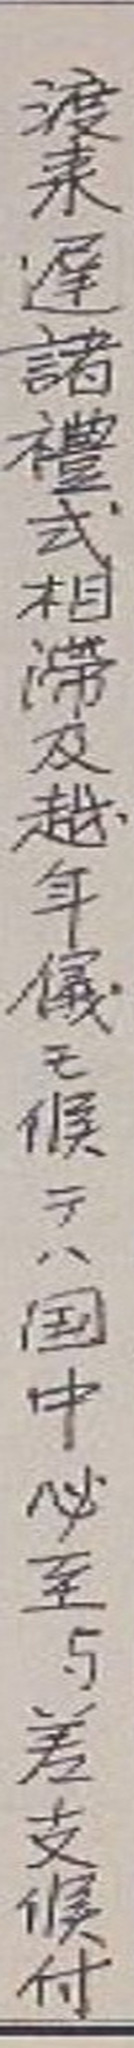渡来遅諸礼式相滞及越年儀も候ては国中必至と差支候付
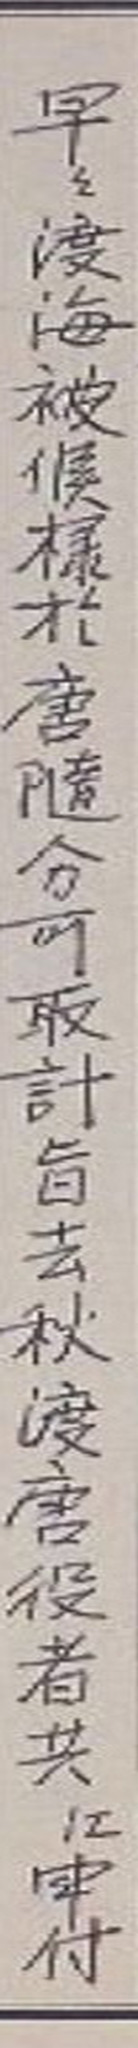早々渡海被候様於唐随分可取計旨去秋唐役者共え申付
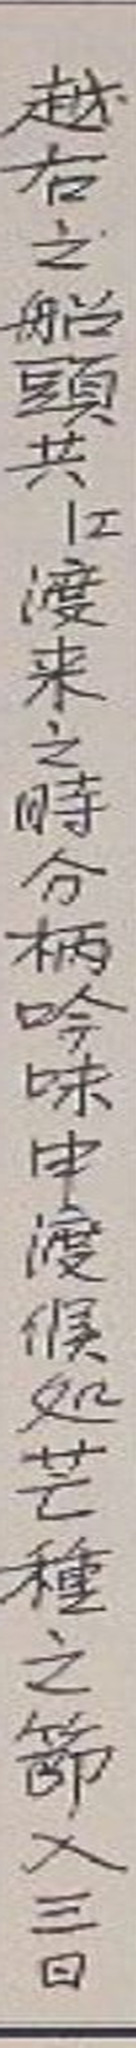越右之船頭共え渡来之時分柄吟味申渡候処芒種之節入三日
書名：支那冊封使来琉諸記 下巻
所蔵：University of the Ryukyus Library
